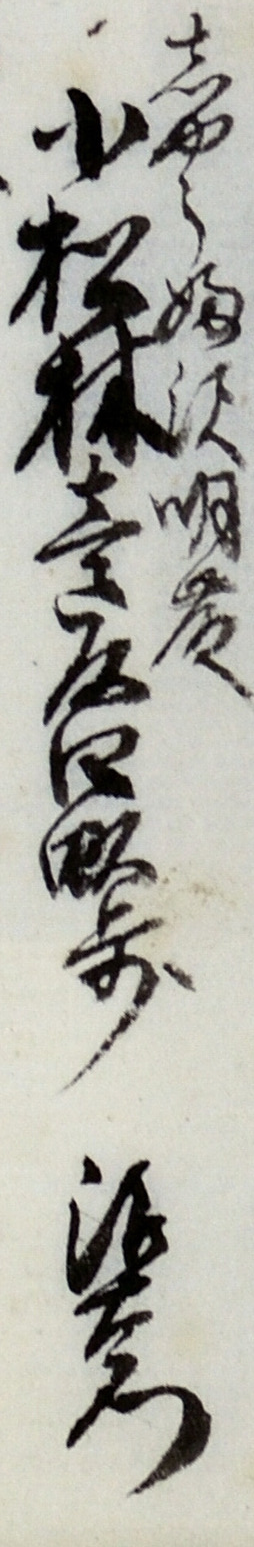小松林壱反四畝歩治右衛門
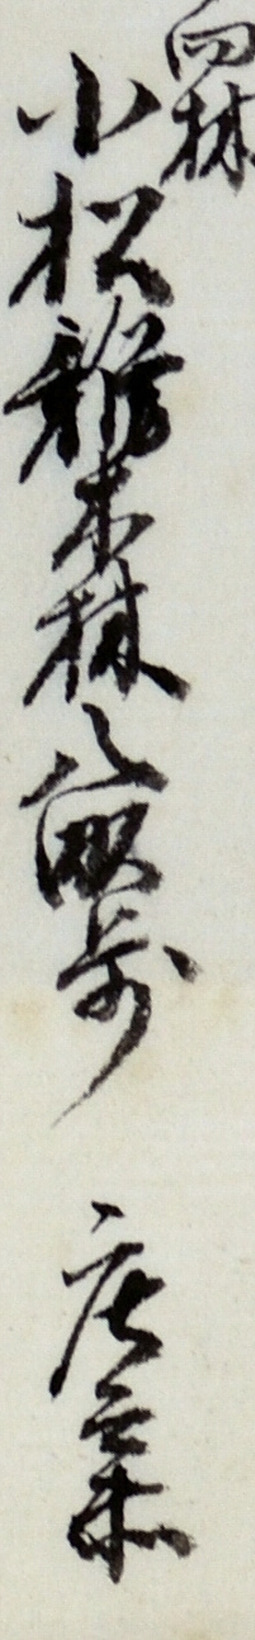小松雑木林八畝歩庄兵衛
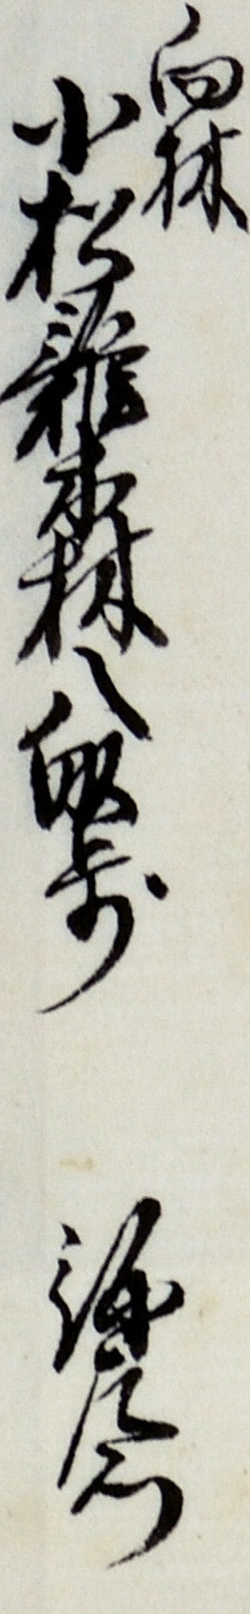小松雑木林八畝歩弥左衛門
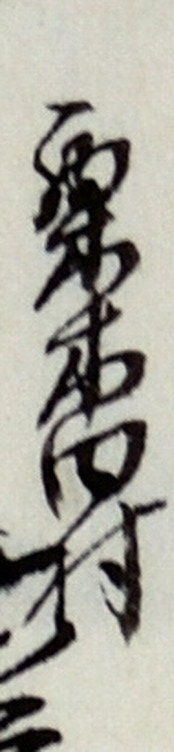栗木田村
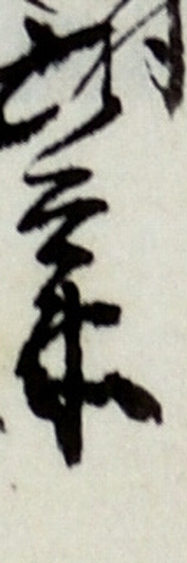九兵衛
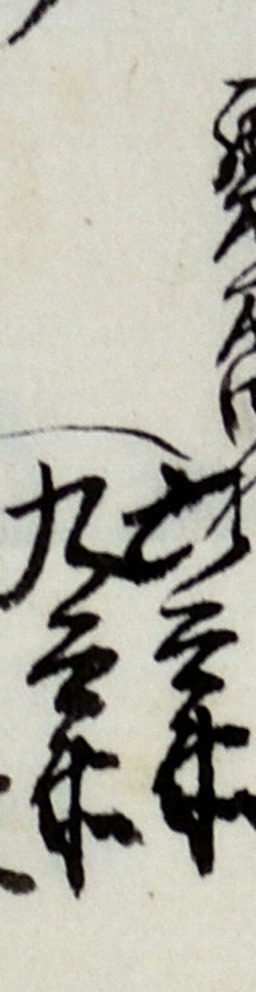九兵衛
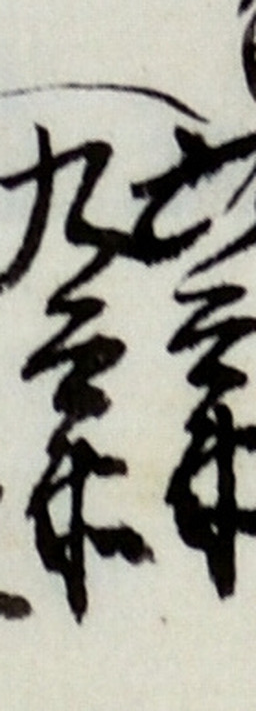九兵衛
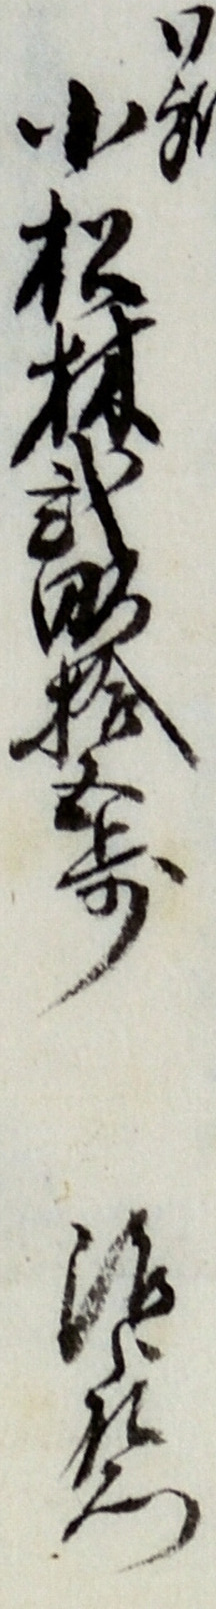小松林弐畝拾五歩治郎左衛門
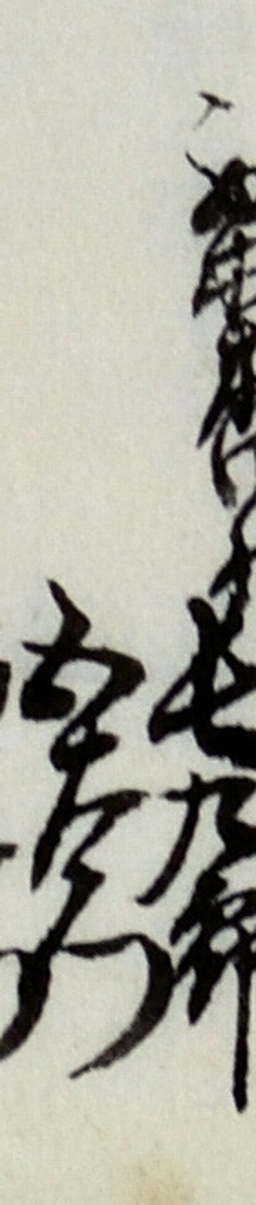市右衛門
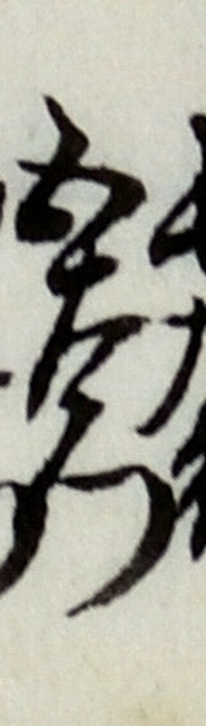市右衛門
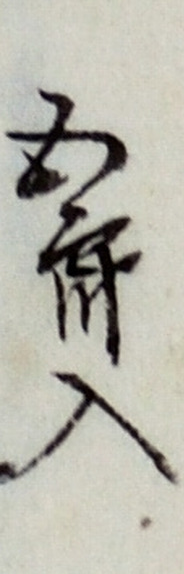五郎入
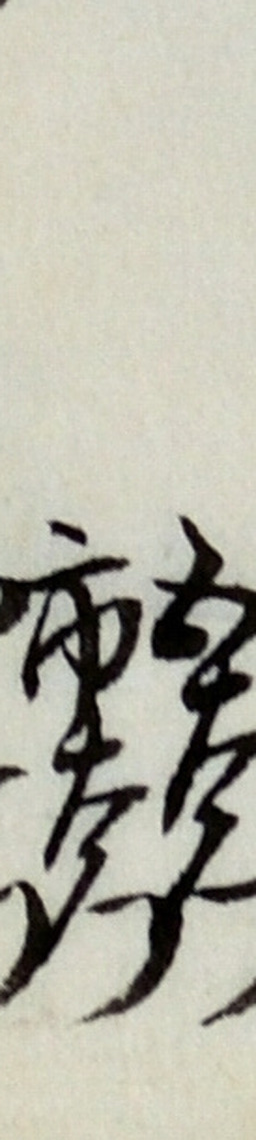市右衛門
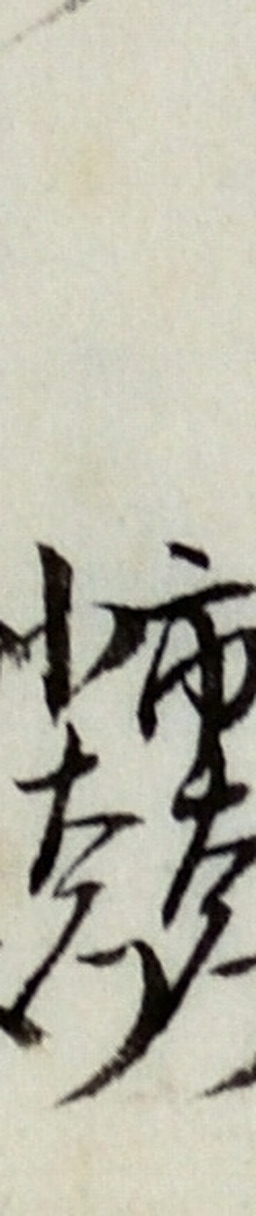小右衛門
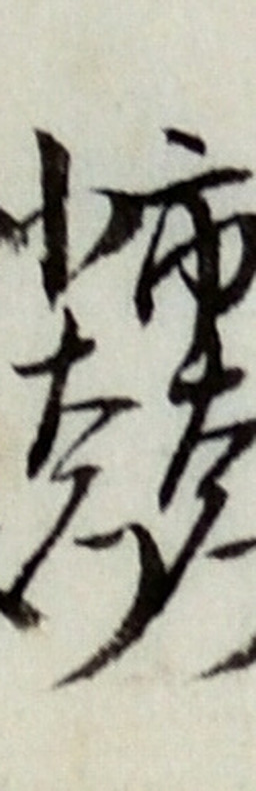小右衛門
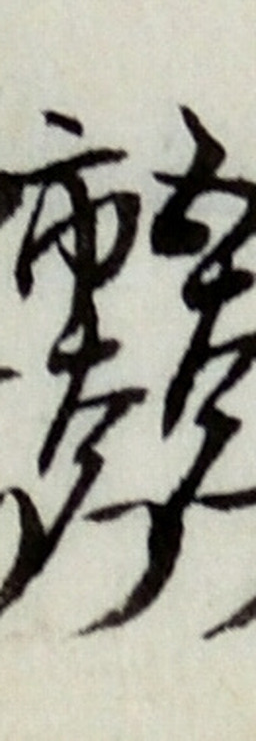市右衛門
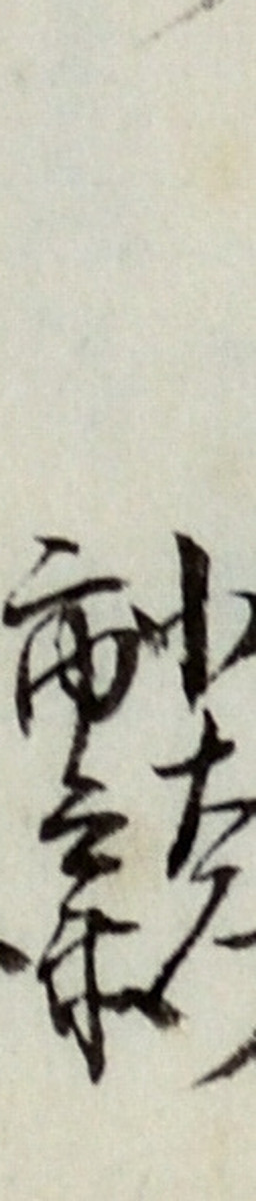市兵衛
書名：御領分中山林社地手控
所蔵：伊那市立高遠町図書館・合同会社AMANE
